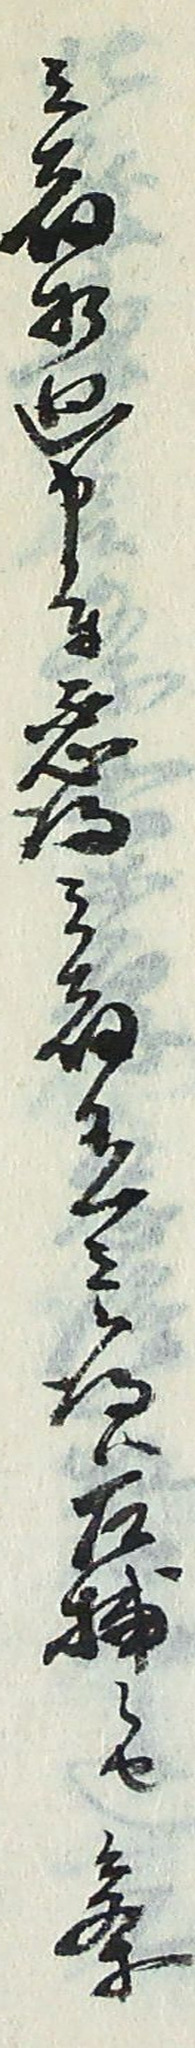之者打廻申付不心得之者有之候得ハ召捕らせ候条
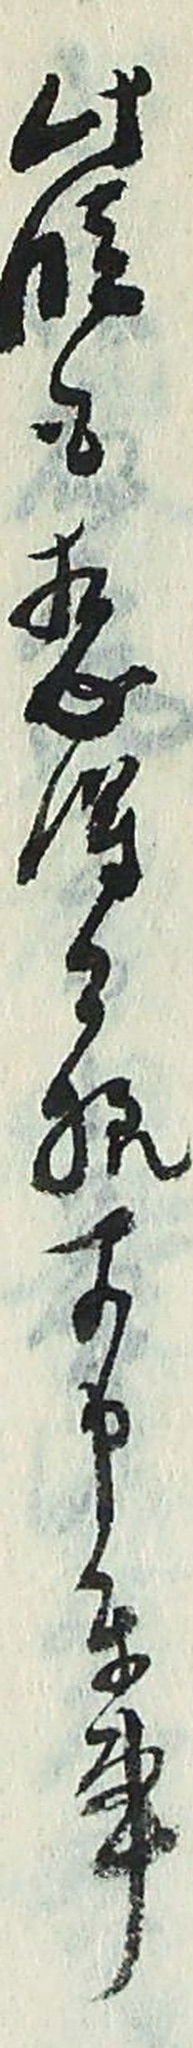此段も相心得候様可申付事
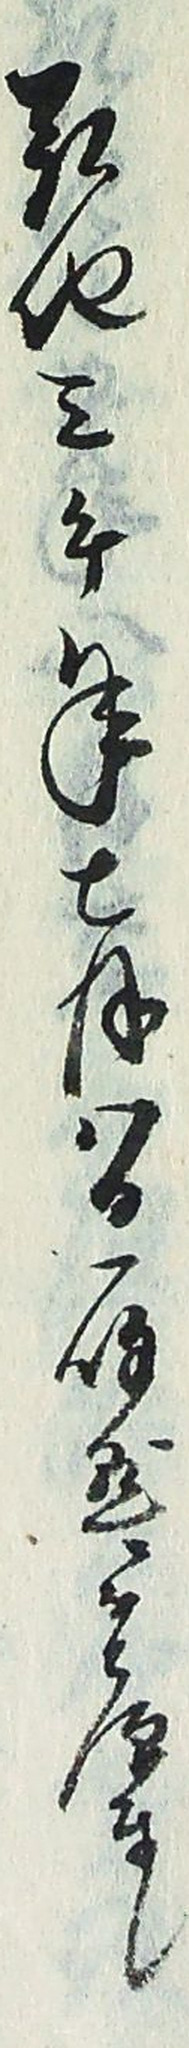弘化三午年七月八日一呼懸ニ而被仰付候
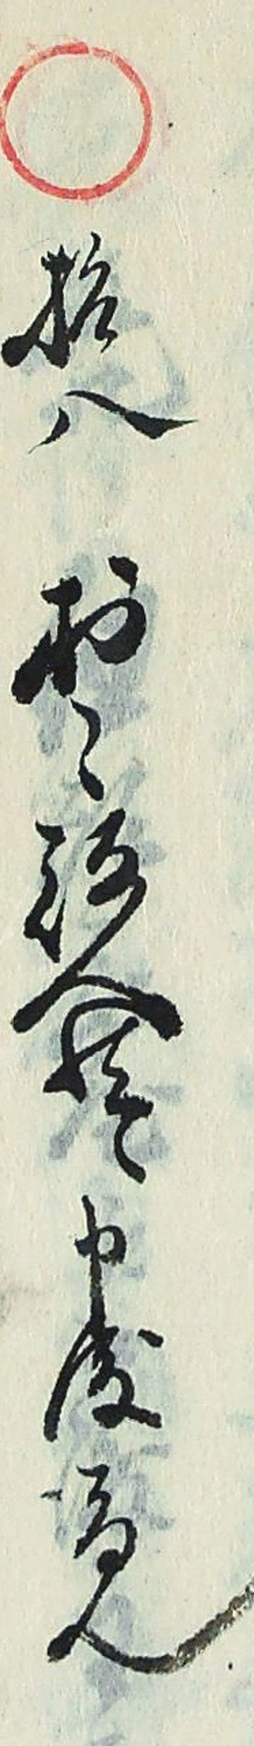○拾八村々役人共へ申渡覚
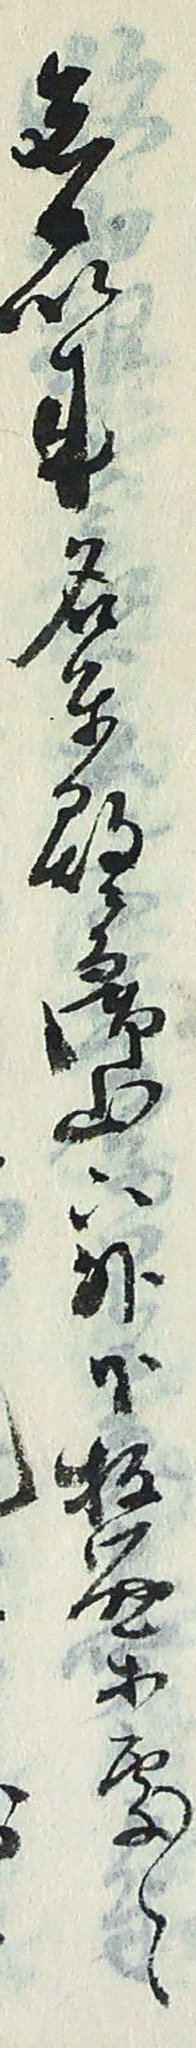先日以来名東郡ニ而御山下外下板筋等處々
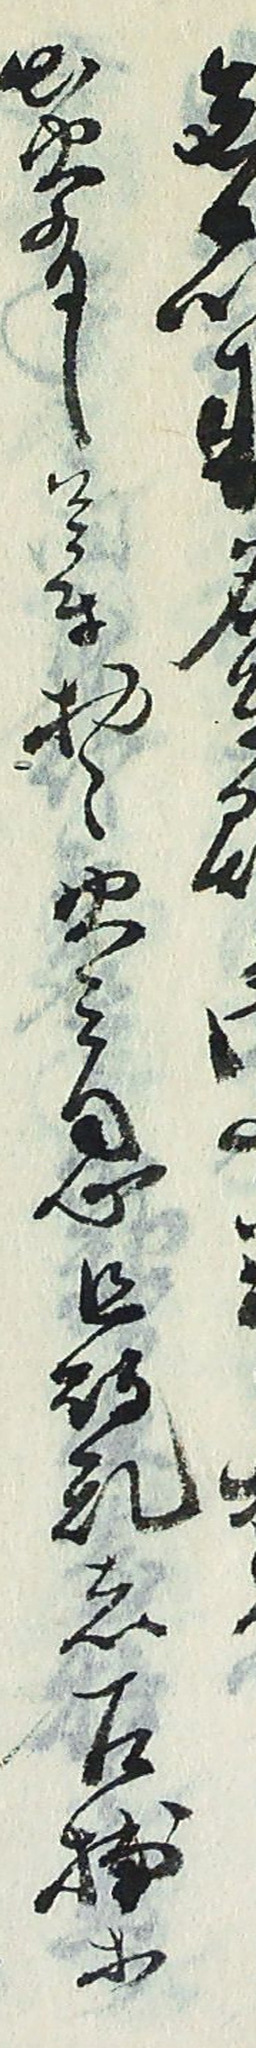出火有之候ニ付村々火之用心且胡乱者召捕等
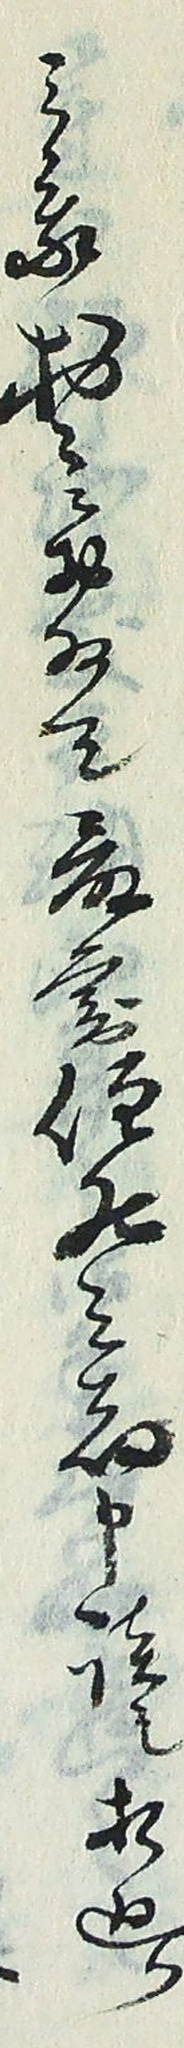之義村々ニおゐて最寄住居之者申談シ打廻り
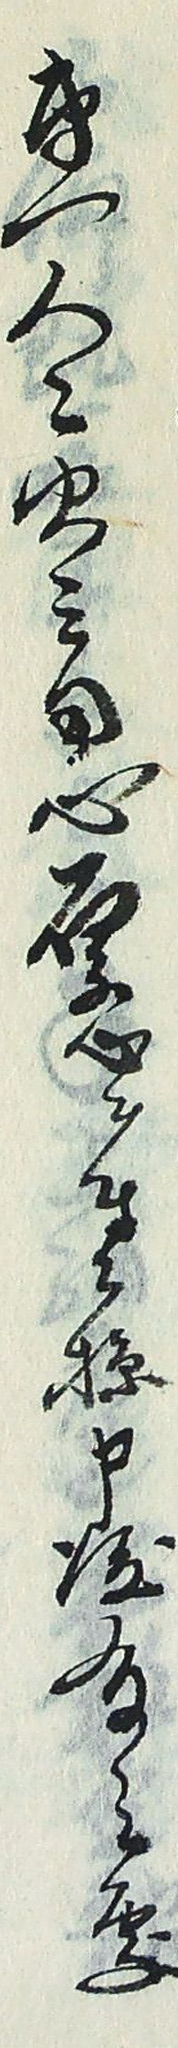第一人々火之用心厚心ヲ付候様申渡有之處
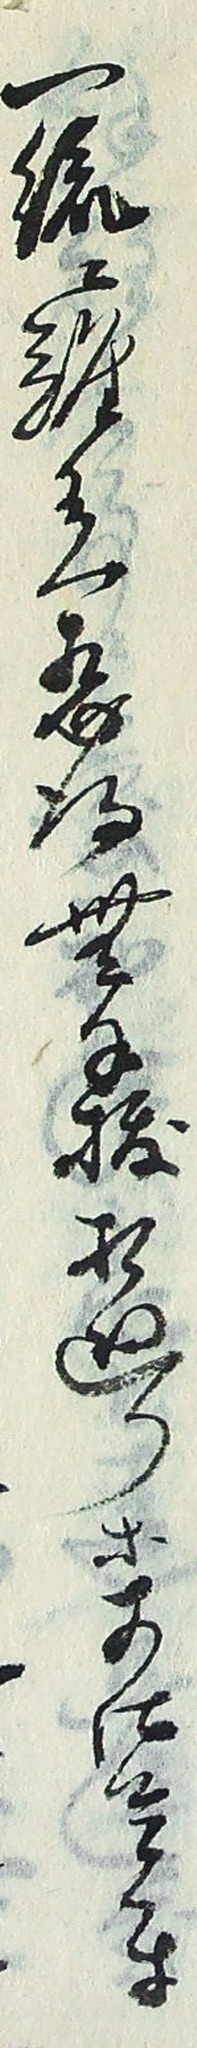一統ニ難有相心得無手抜打廻り等可仕候ニ付
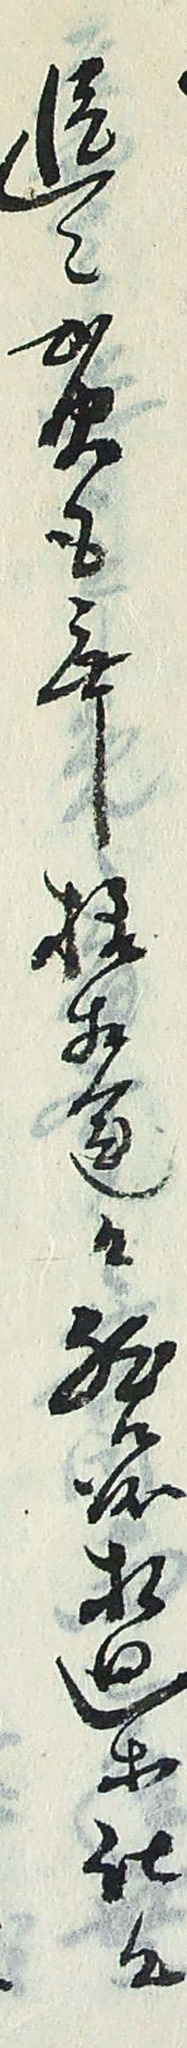追々出火も無之様相運候然ル所打廻等仕候
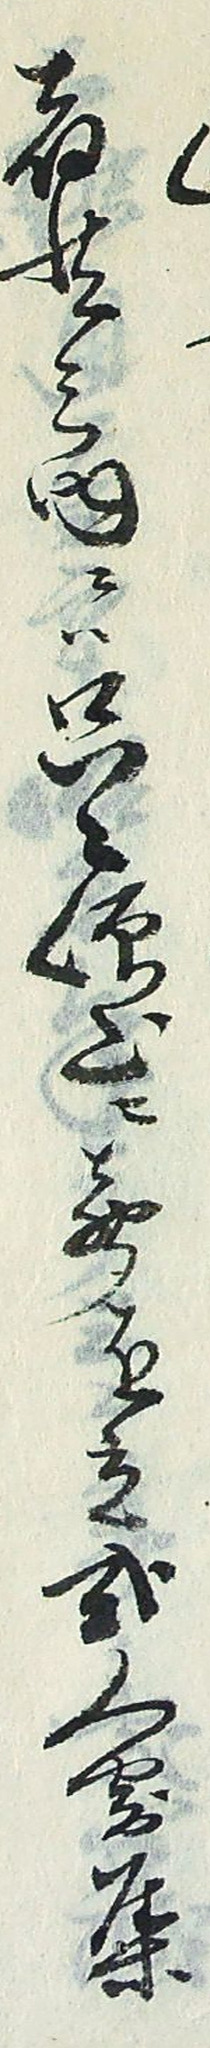者共之内ニハ只々仰上セ聲を立或人寄集
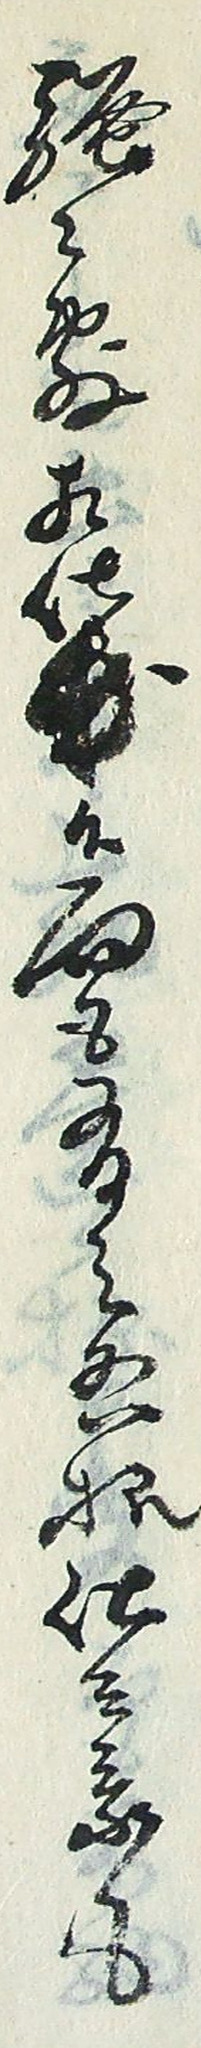騒々敷相仕成候向も有之右様仕候義も

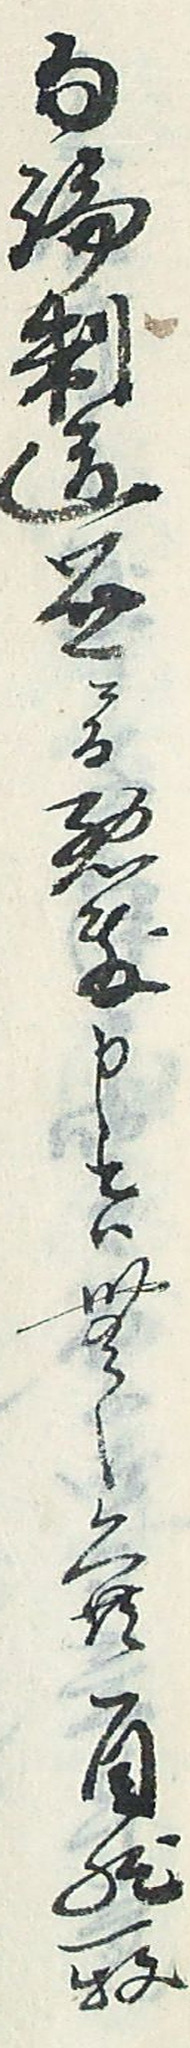勿論制道筋ニ而悪敷申ニハ無之候へ共自然一牧
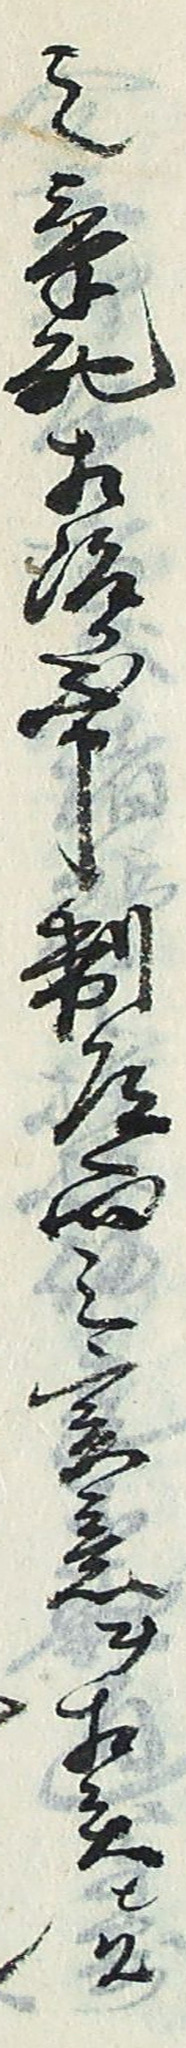之気配相治り不申制道向之実意ヲ相失と候
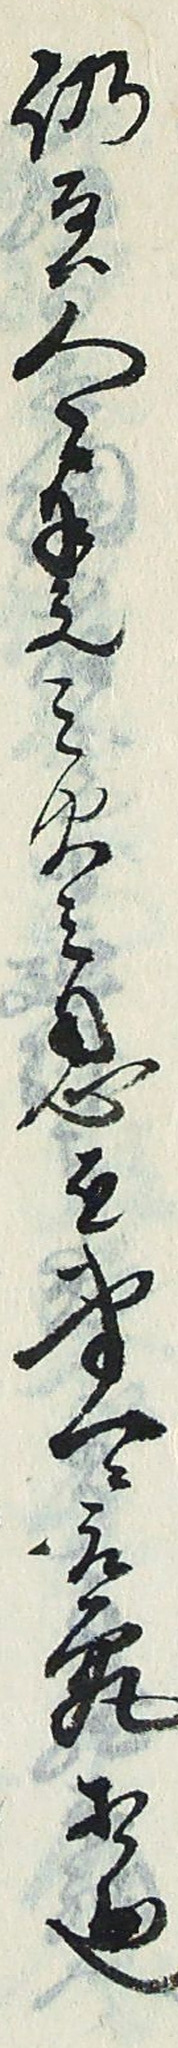仍而ハ人々手元之火之用心を第一ニ取究相廻
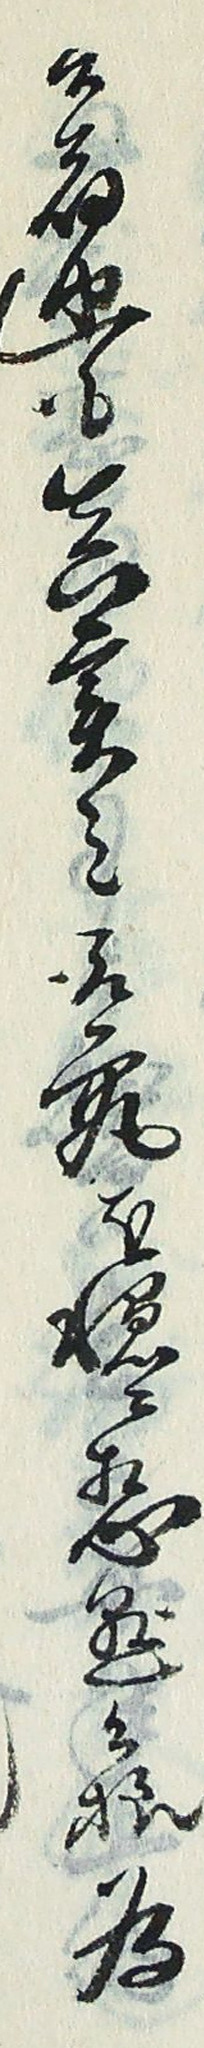候者迚も真実之取究を穏ニ相心懸候様為
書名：諸御趣意書并御下知向之写
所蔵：鳴門教育大学 Naruto University of Education
